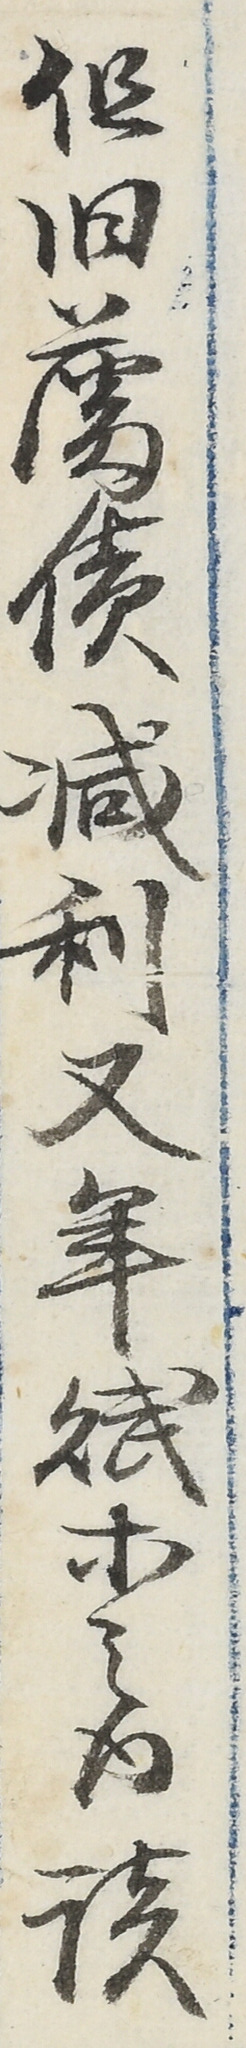但旧藩債減利又年賦等之内談

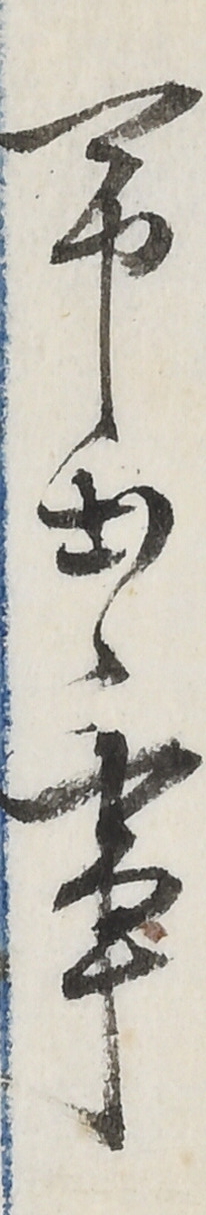可申出候事
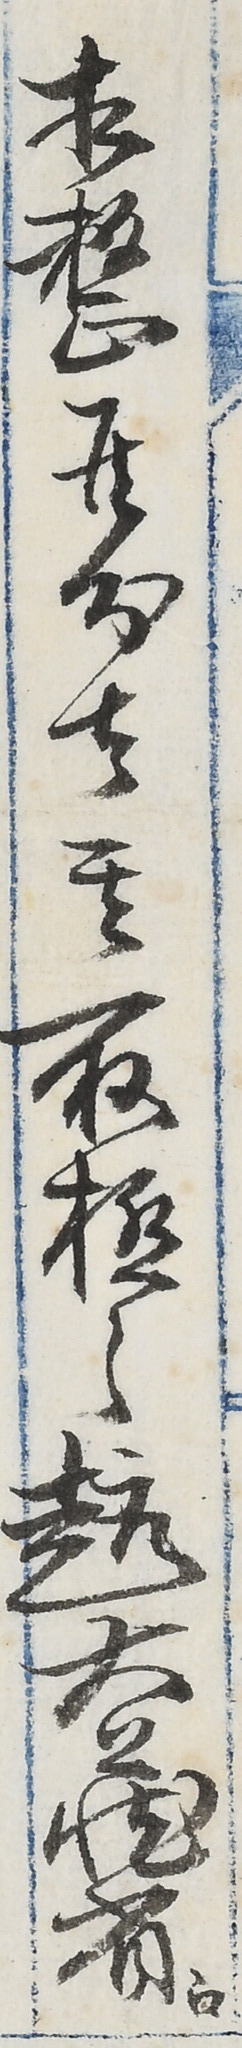相整候分者其取極之趣大蔵省江
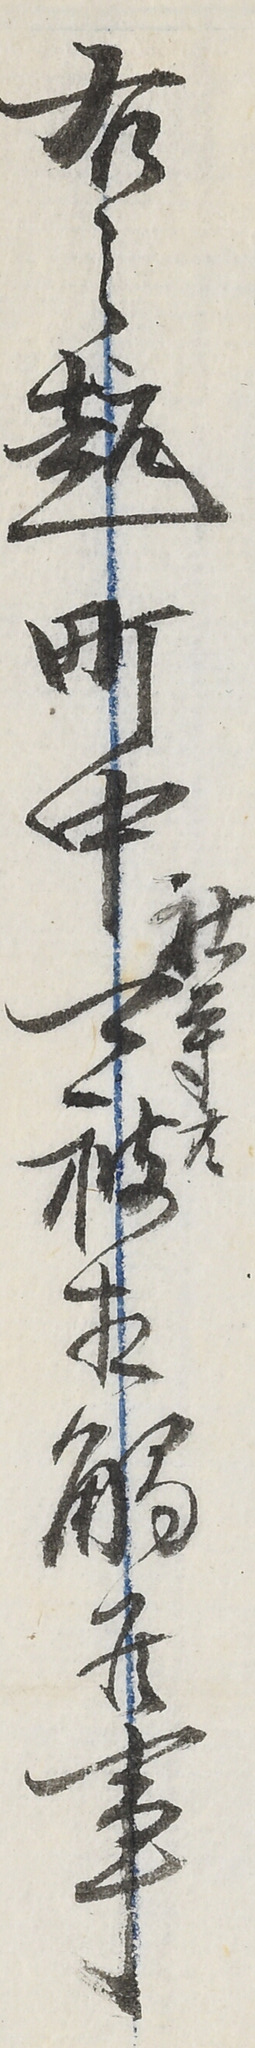右之趣町中社寺共可被相触候事
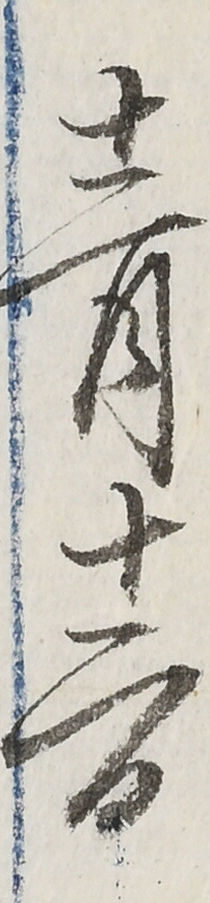十二月十二日
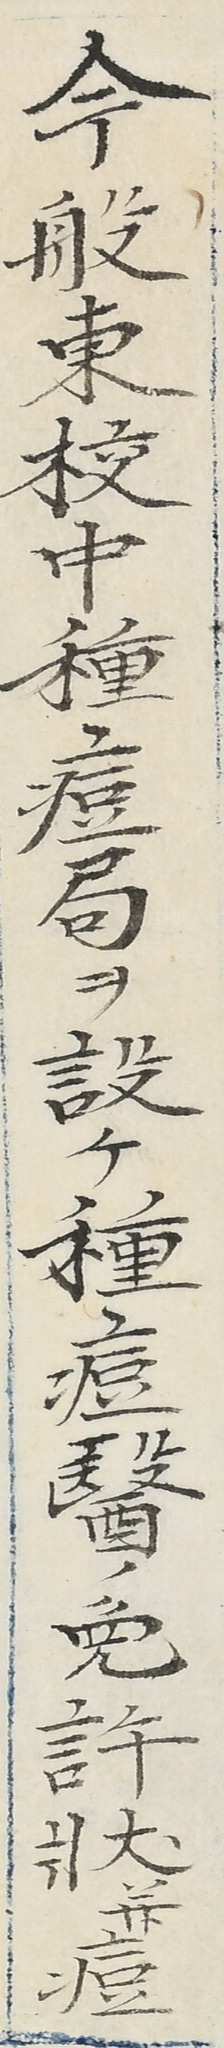今般東校中種痘局ヲ設ケ種痘医ノ免許状幷痘
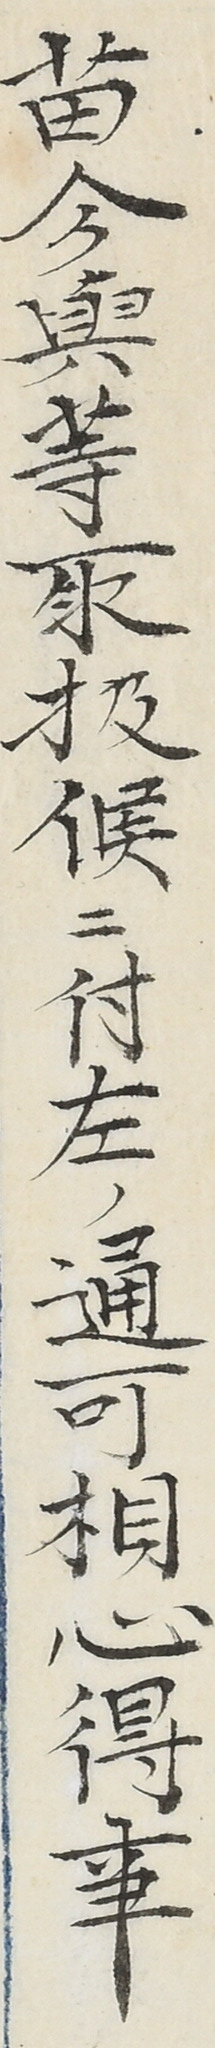苗今与等取扱候ニ付左ノ通可相心得事
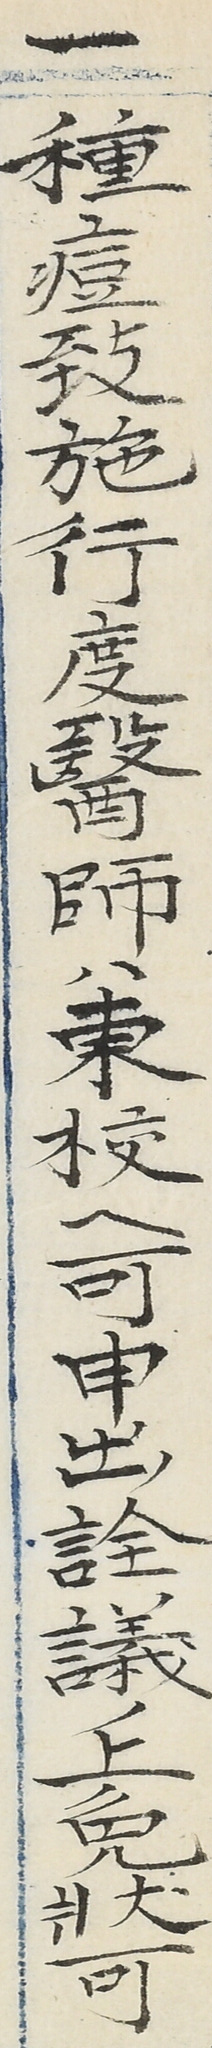一種痘致施行度医師ハ東校へ可申出詮議ノ上免状可
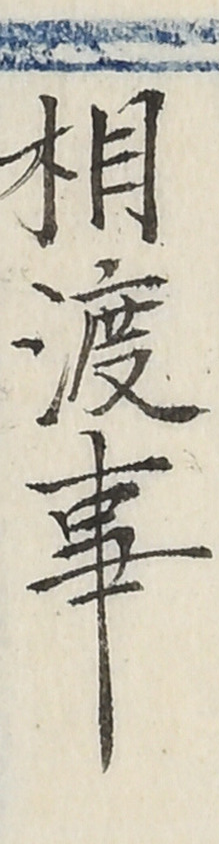相渡事
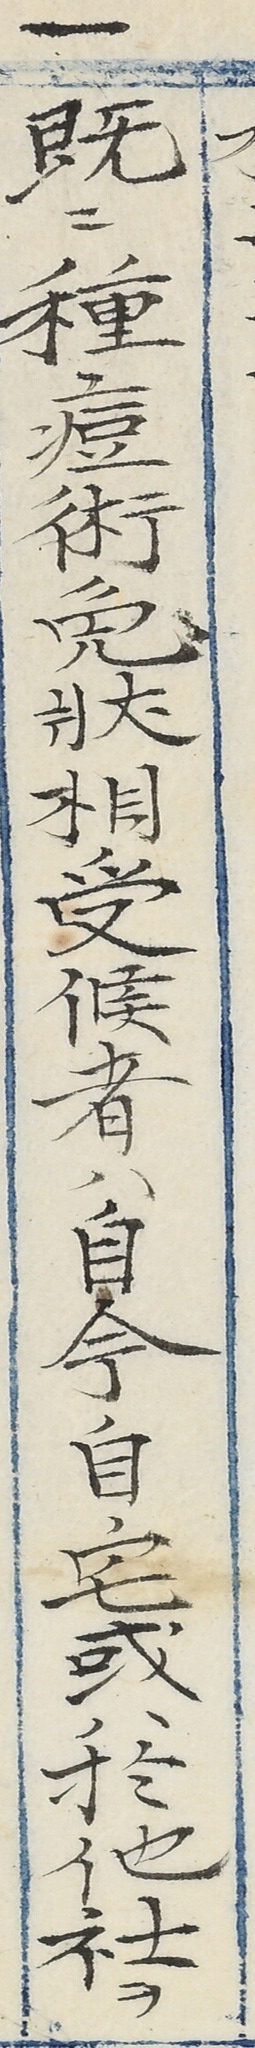一既ニ種痘術免状相受候者ハ自今自宅或ハ於他社ヲ
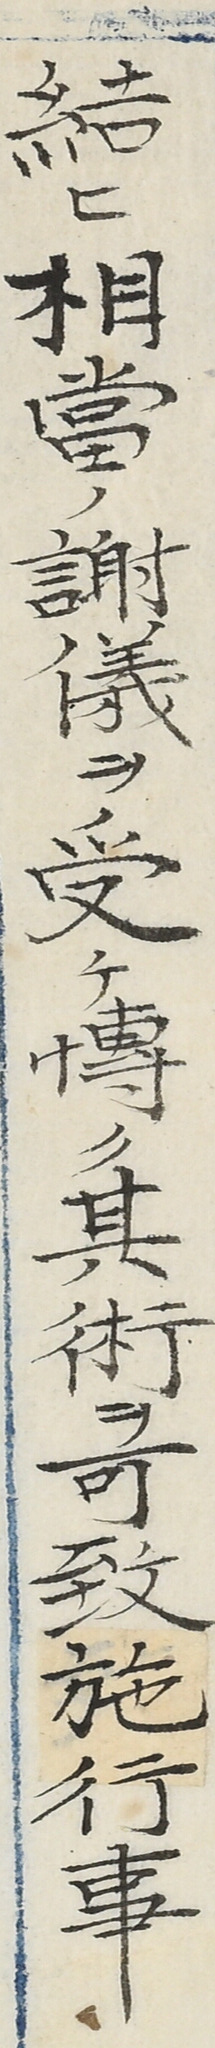結ヒ相当ノ謝儀ヲ受ケ博ク其術ヲ可致施行事
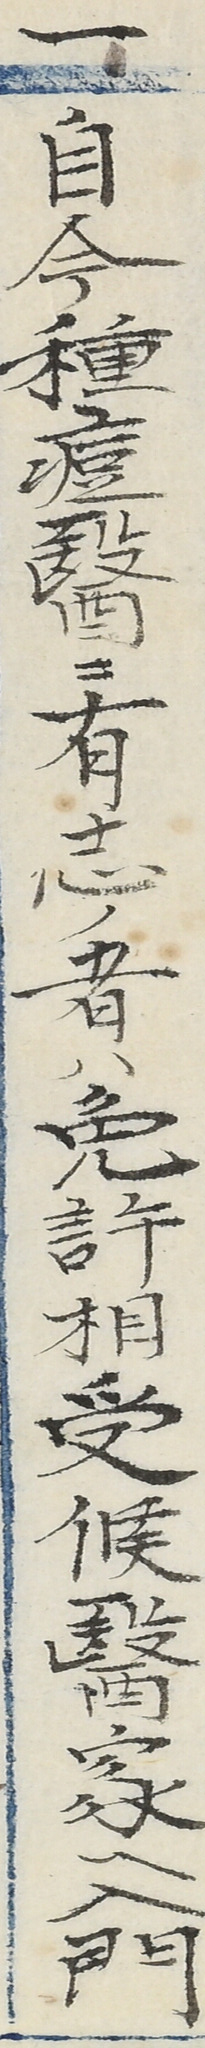一自今種痘医ニ有志ノ者ハ免許相受候医家へ入門
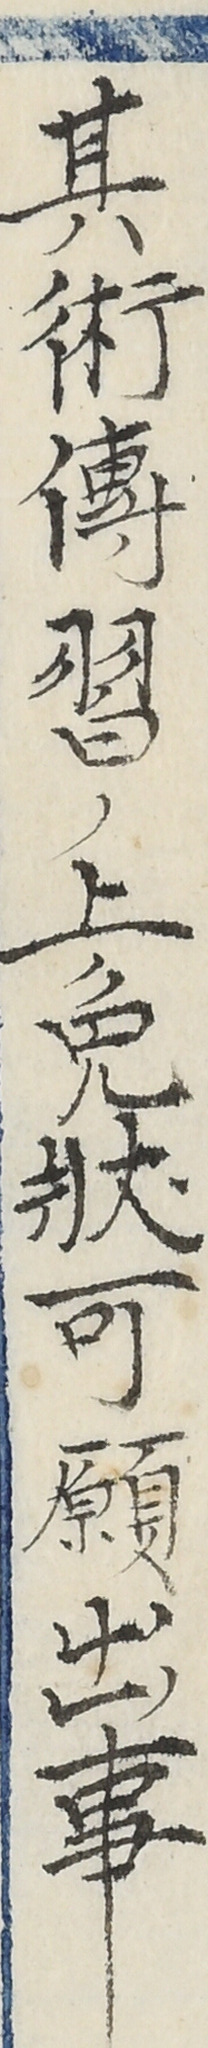其術伝習ノ上免状可願出事
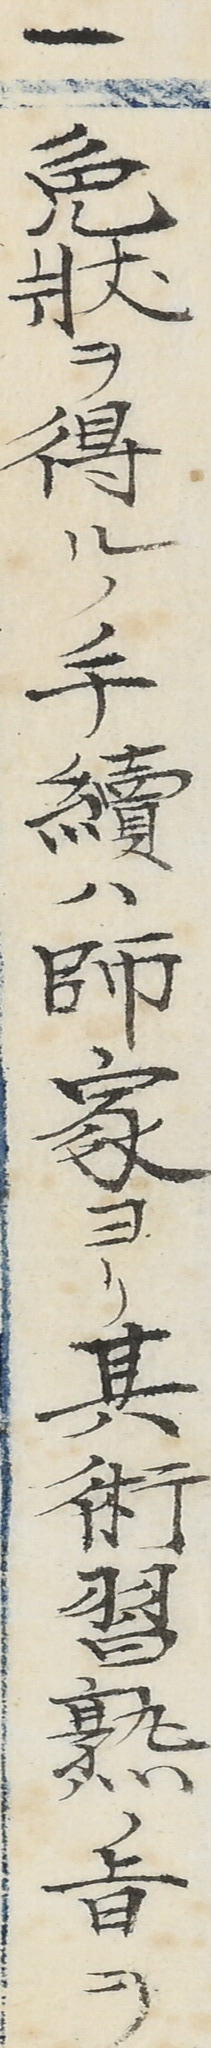一免状ワ得ルノ手続ハ師家ヨリ其術習熟ノ旨ヲ

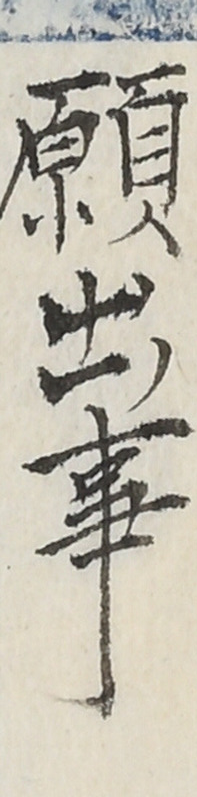願出事
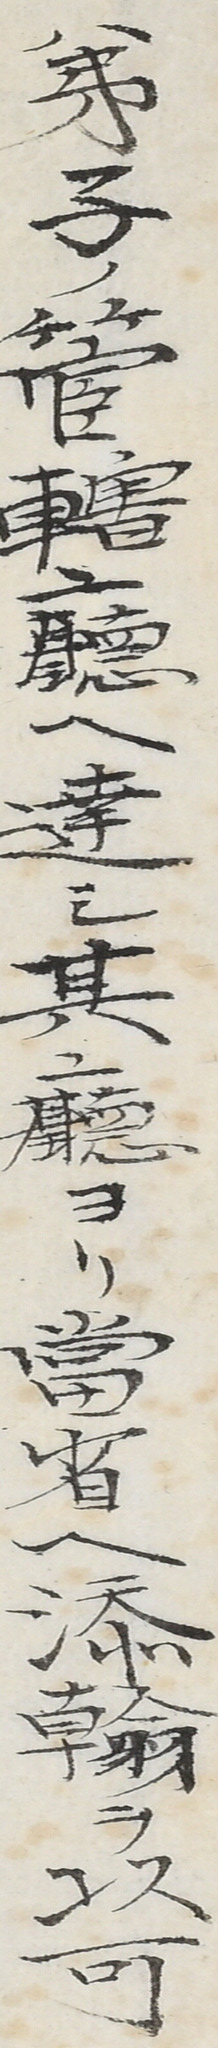弟子ノ管轄庁へ達シ其庁ヨリ当省へ添翰ヲ以可
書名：布達書留
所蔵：伊那市立高遠町図書館・合同会社AMANE
